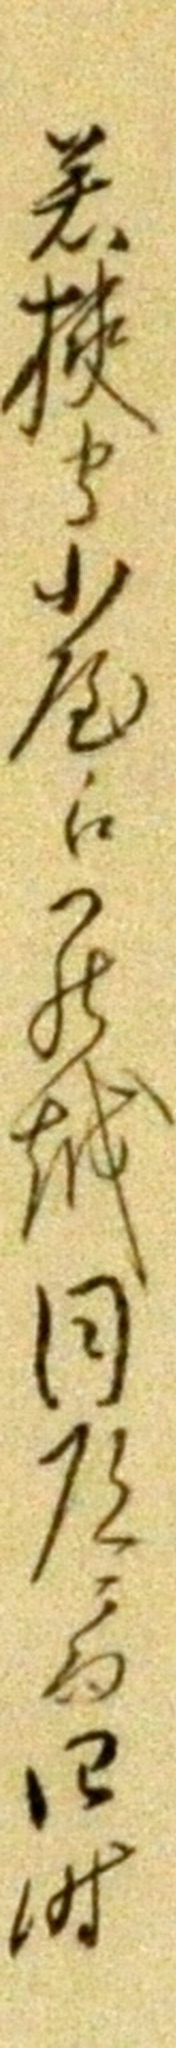若狭守小屋え罷越同道ニ而四時
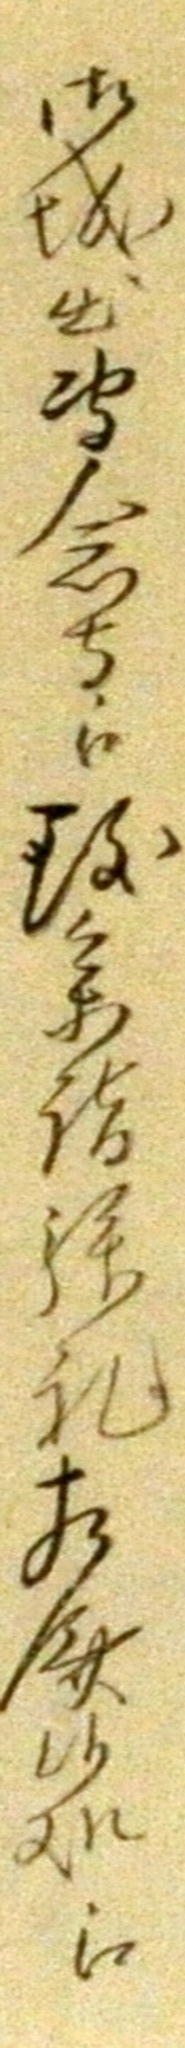御城出専念寺え致参詣拝礼相済候処え
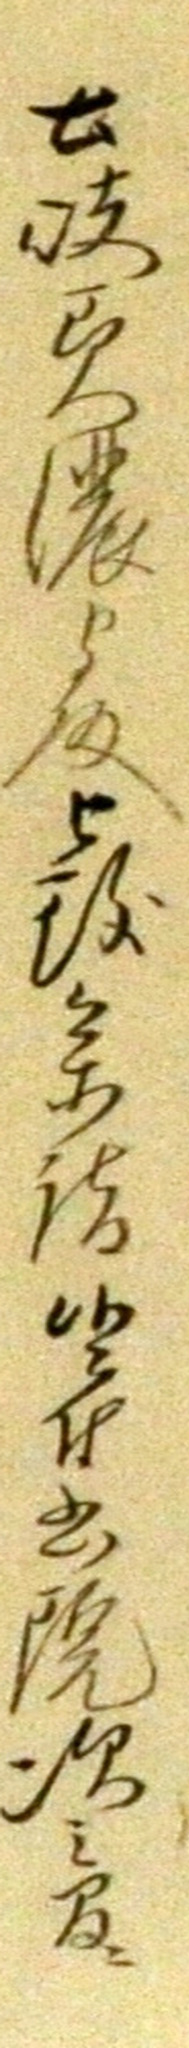土岐美濃守殿被致参詣候ニ付書院次之間ニ
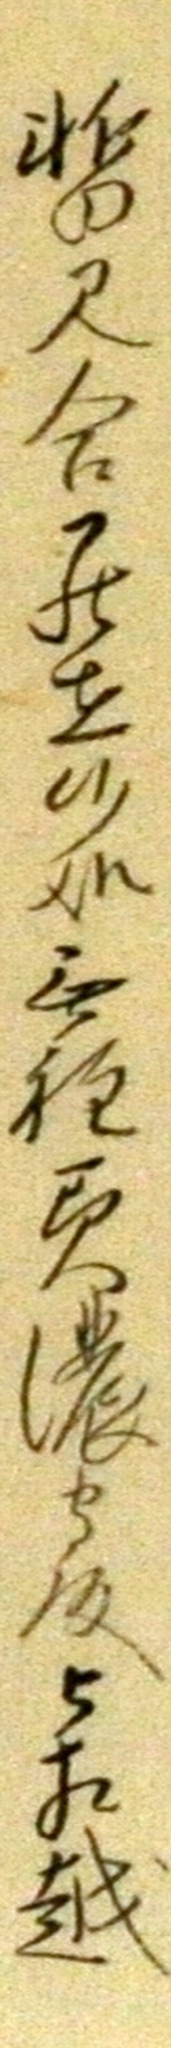暫見合罷在候処無程美濃守殿被相越
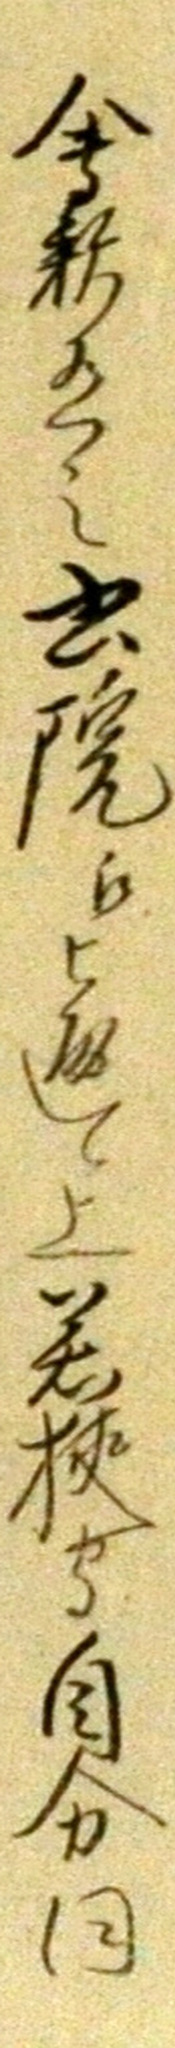会釈有之書院え被通候上若狭守自分同
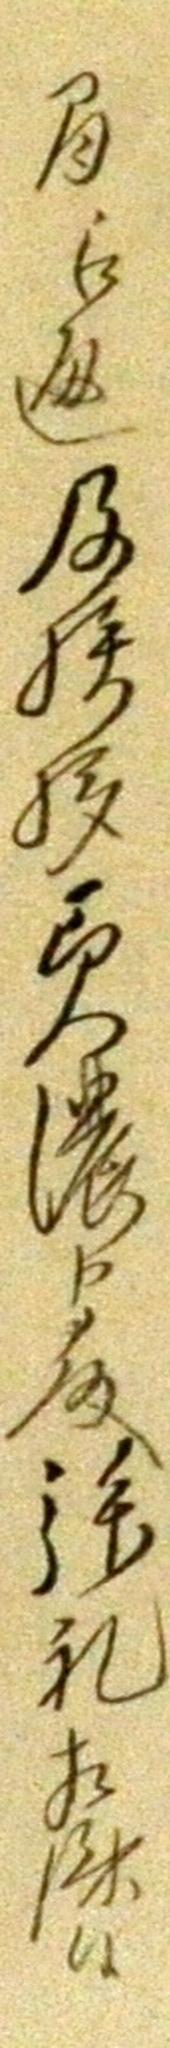間え通及挨拶美濃守殿拝礼相済候
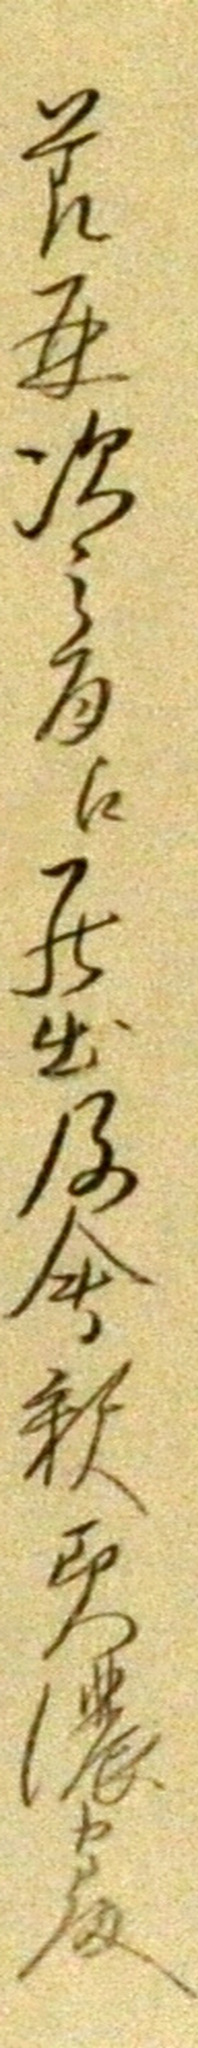節再次之間え罷出及会釈美濃守殿
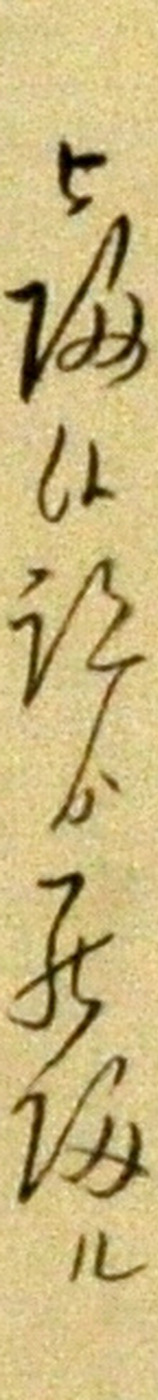被帰候跡ゟ罷帰ル
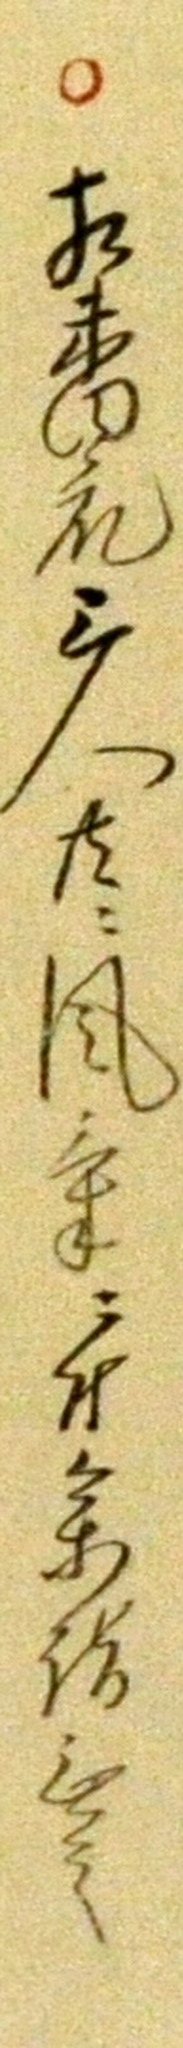相番衆三人共ニ風氣ニ付参詣無之
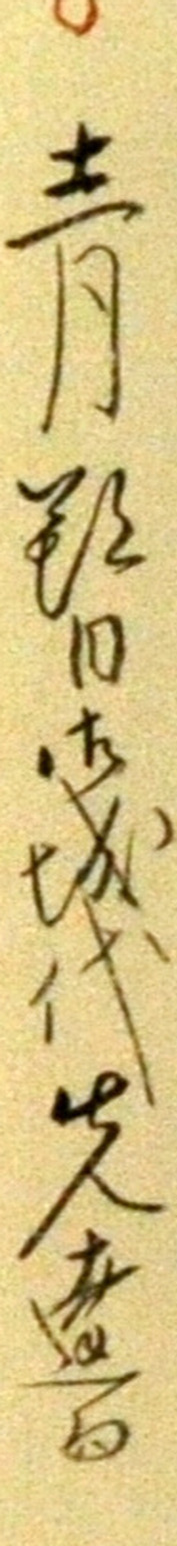十二月朔日御城代先達而

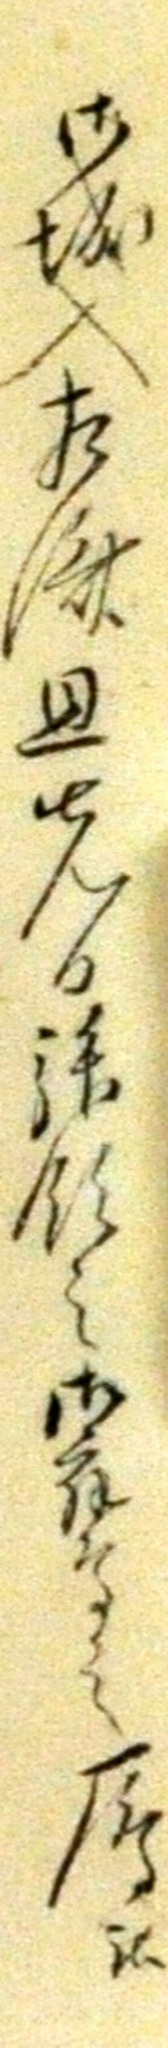御城入相済且先日拝領之御鷹之雁被
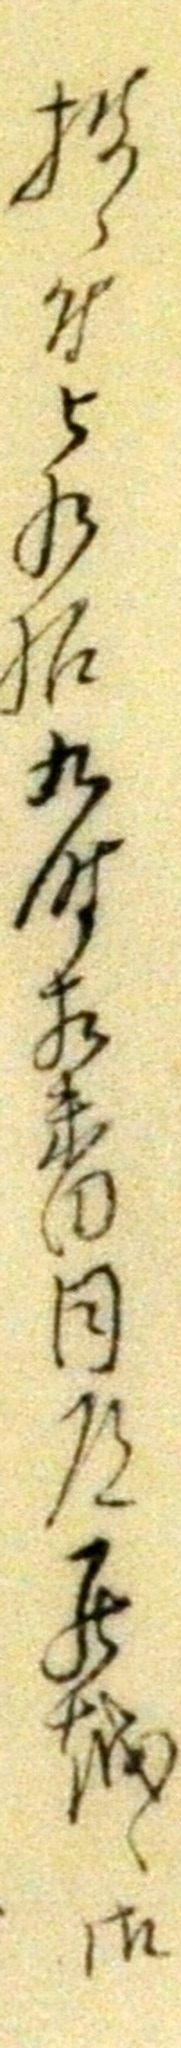披候付被相招九時相番同道罷越候御
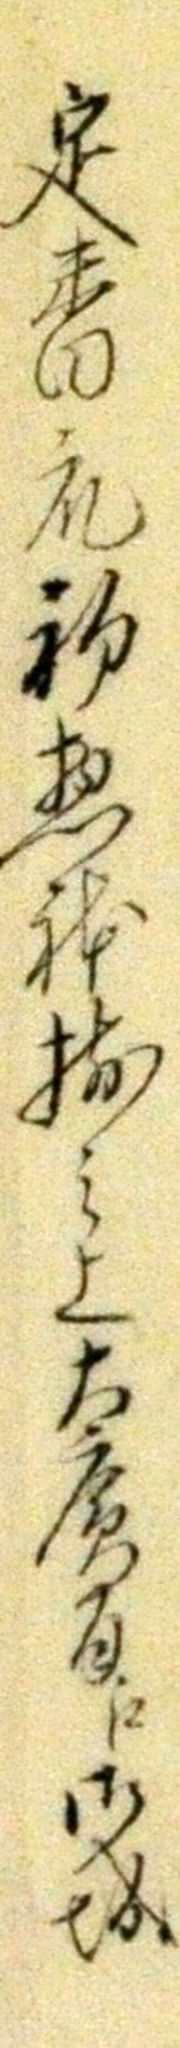定番衆初惣躰揃之上大広間え御城
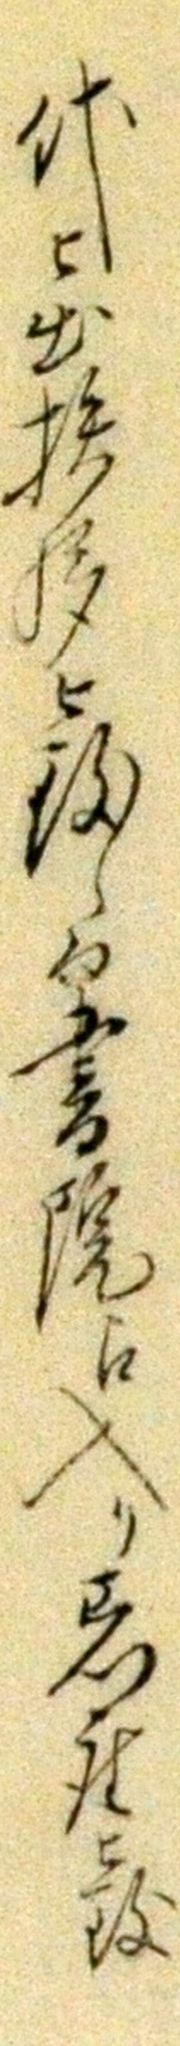代被出挨拶被致候而書院え入り着座被致
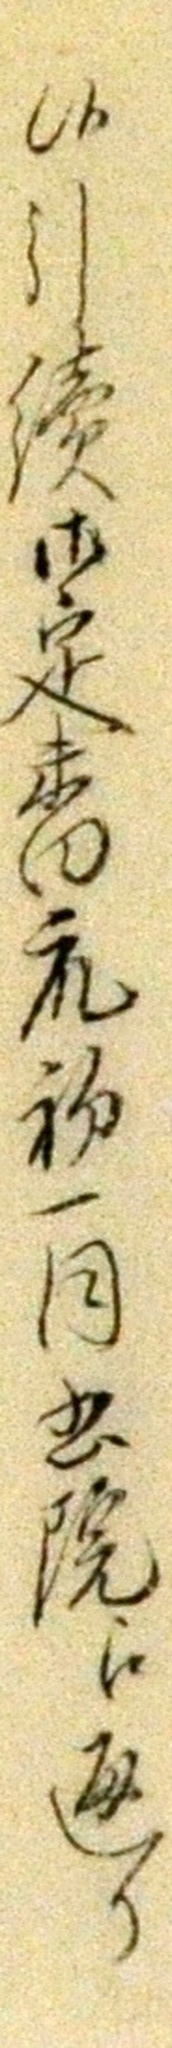候引続御常番衆初一同書院え通り
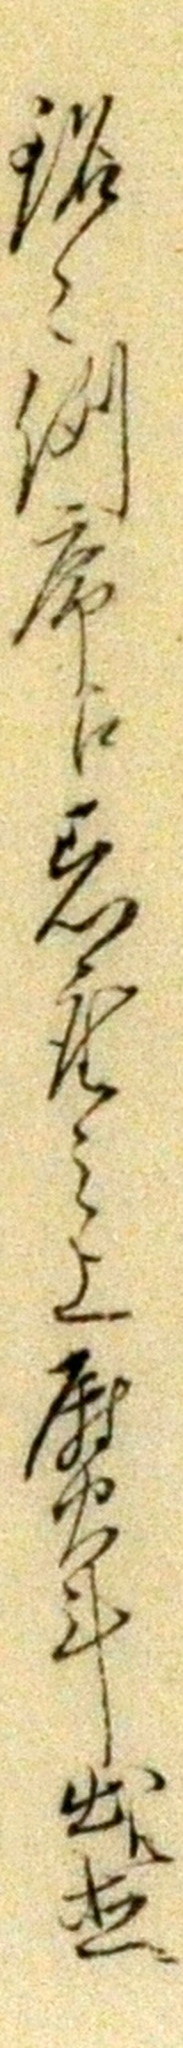銘々例席え着座之上熨斗出ル直ニ
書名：大阪加番関係諸書留〔一括〕
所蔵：伊那市立高遠町図書館・合同会社AMANE
